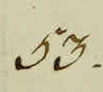53
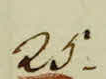25
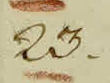23
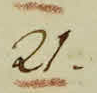21
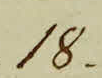18
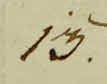13
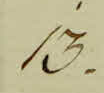13
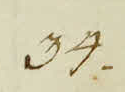34
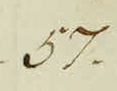57
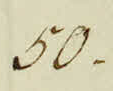50
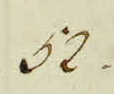52
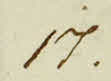17
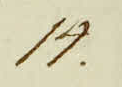14
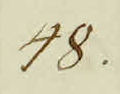48
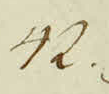42
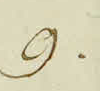9
